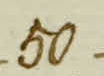50
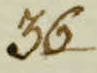36
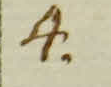4.
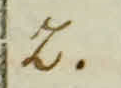2.
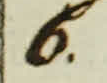6.
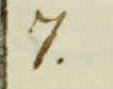7.
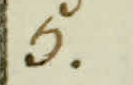5.
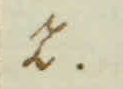2.
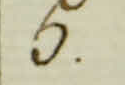5.
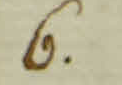6.
